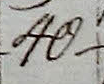40
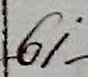61
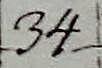34
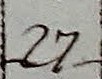27
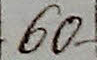60
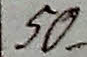50
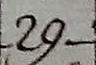29
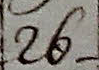26
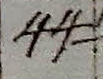44
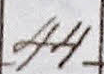44
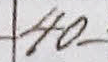40
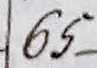65
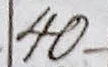40
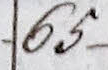65
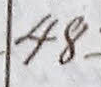48
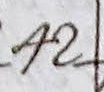42
